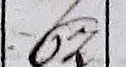62
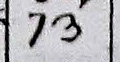73
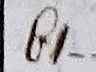61
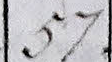57
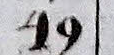49
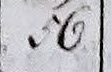56
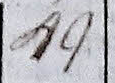49
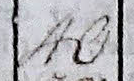40
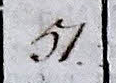51.
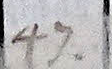47
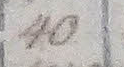40
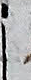2
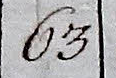63
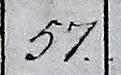57.
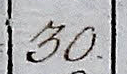30.
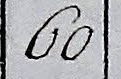60
